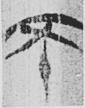不
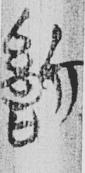○（慎）
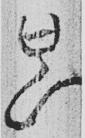也
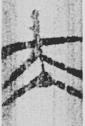夫
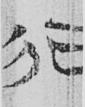行
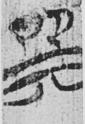巽
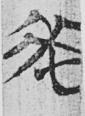華
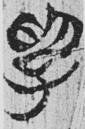○（學）
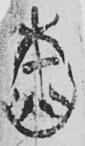本B（本）
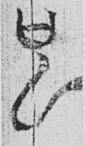也
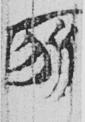所
